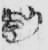○（食）
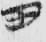田
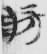○（病）
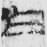於
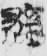責
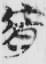骨
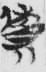儥
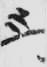之
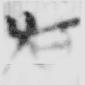左
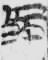馭（御）
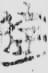遊
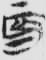晨
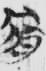骨
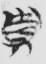賈
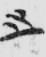之
